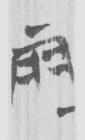雨
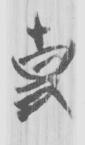吏
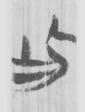此
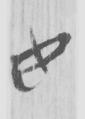女
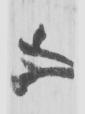之
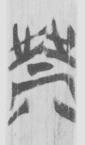{舛几}
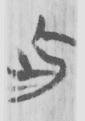此
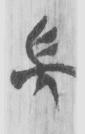𡵂
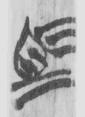馬
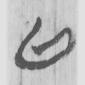㠯（以）
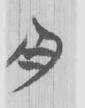舟
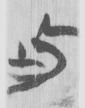此
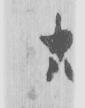{十八}
